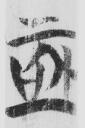亟
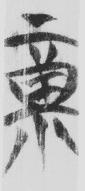福
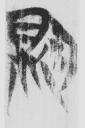則
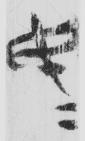民=
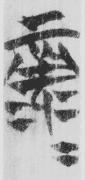彔=
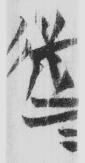迀=
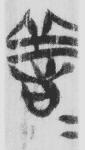善=
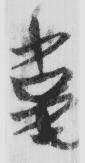韋
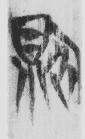則
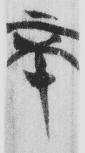不
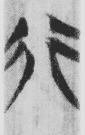行
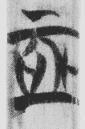亟
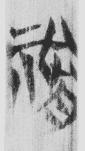禍
